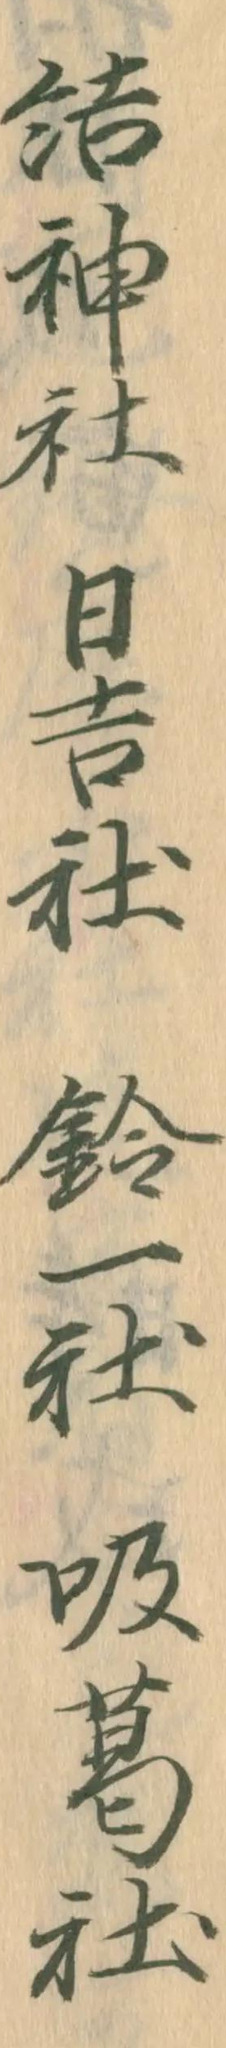結神社日吉社鈴一社吸葛社
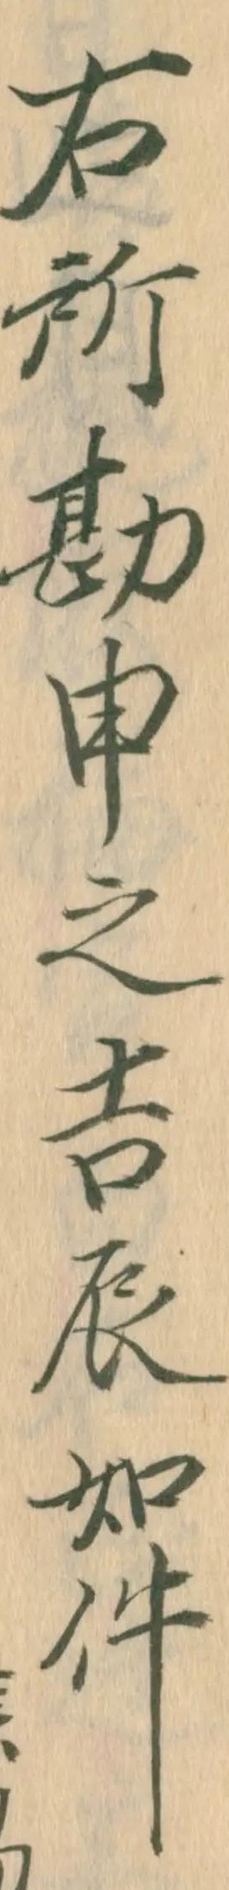右所勘申之吉辰如件
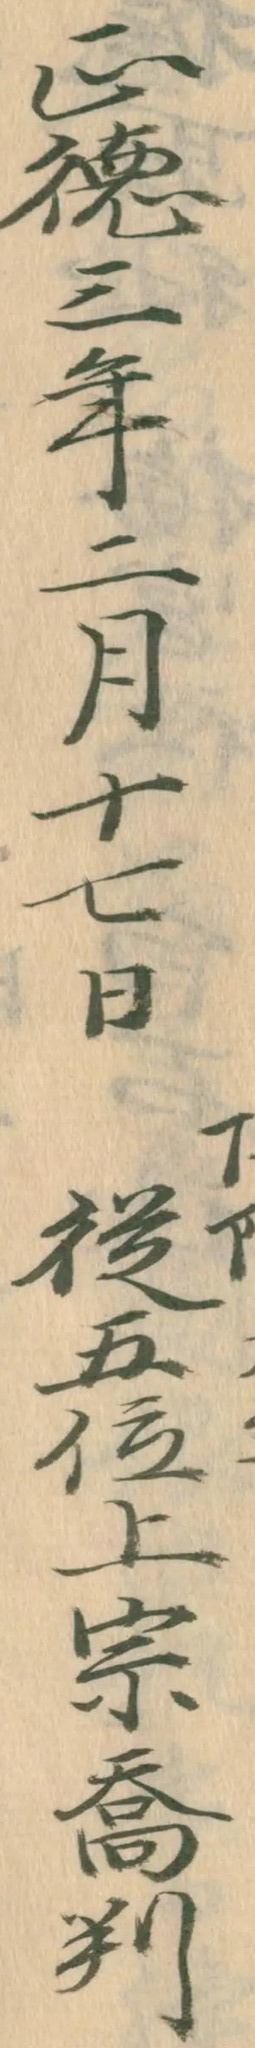正徳三年二月十七日従五位上宗喬判
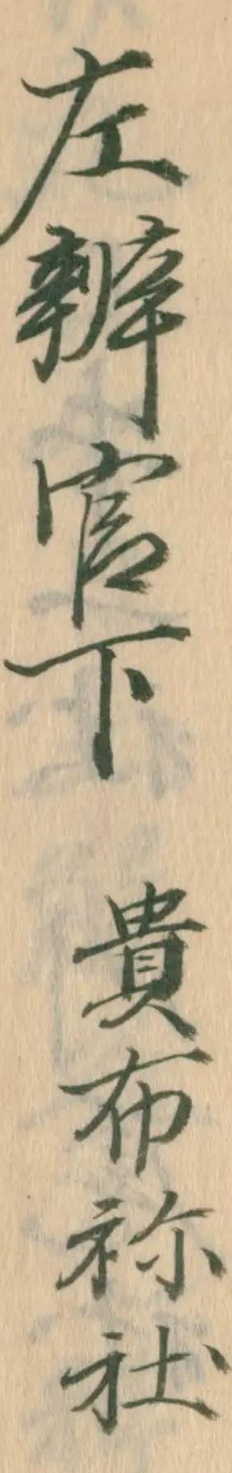左弁官下貴布祢社
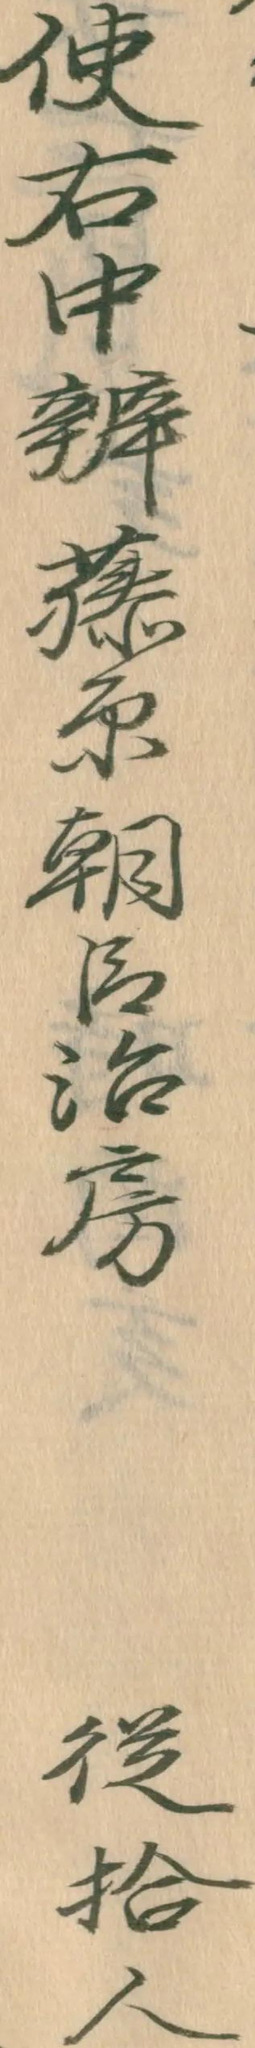使右中弁藤原朝臣治房従拾人
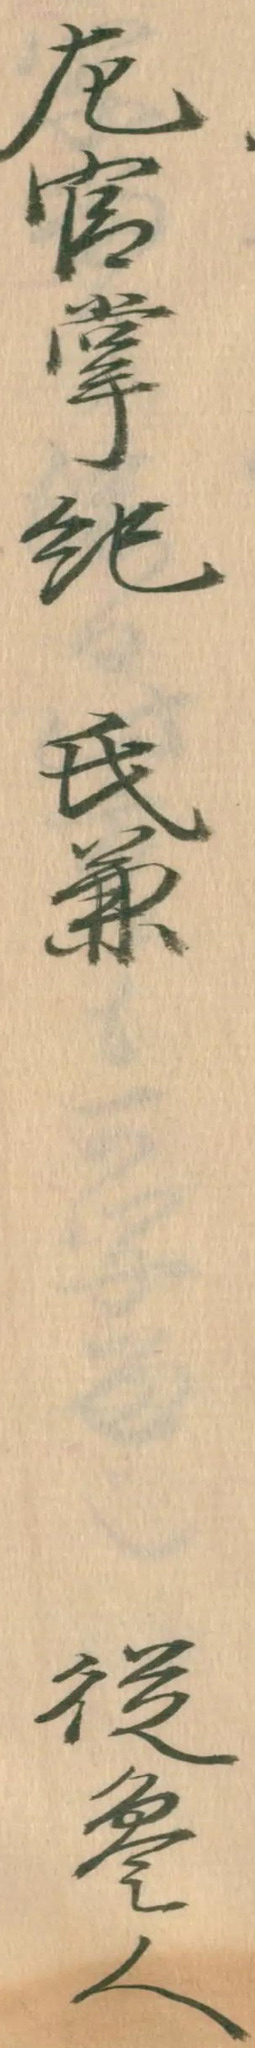左官掌紀氏兼従参人
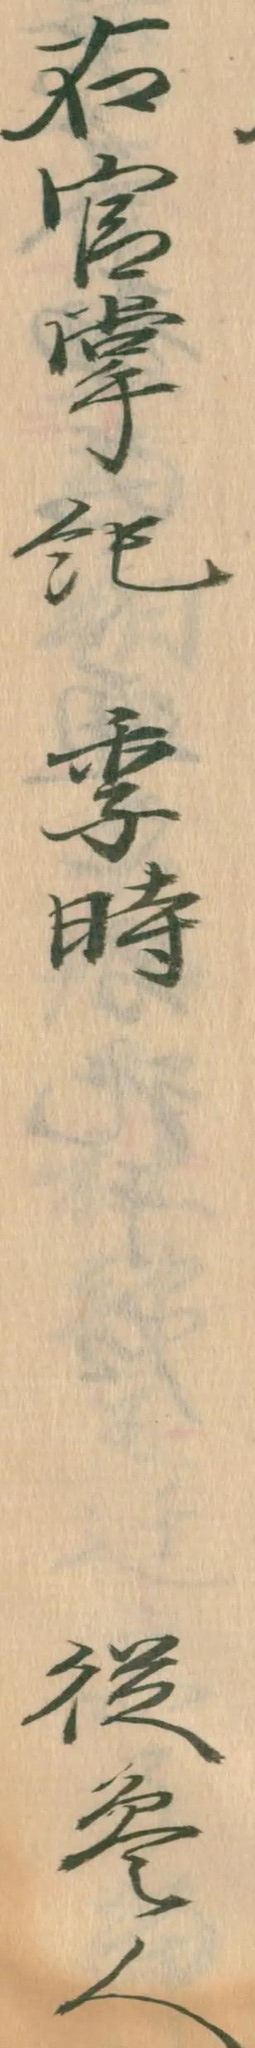右官掌紀季時従参人
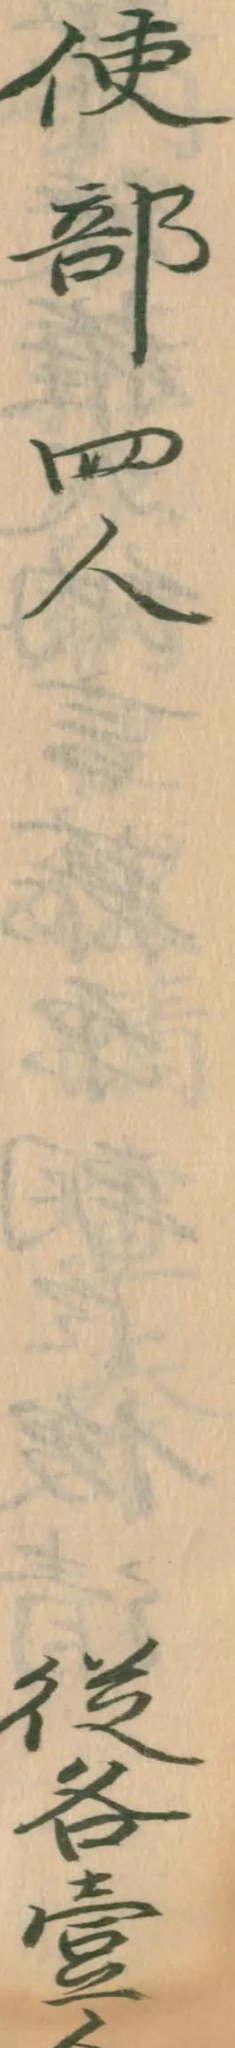使部四人従各壱人
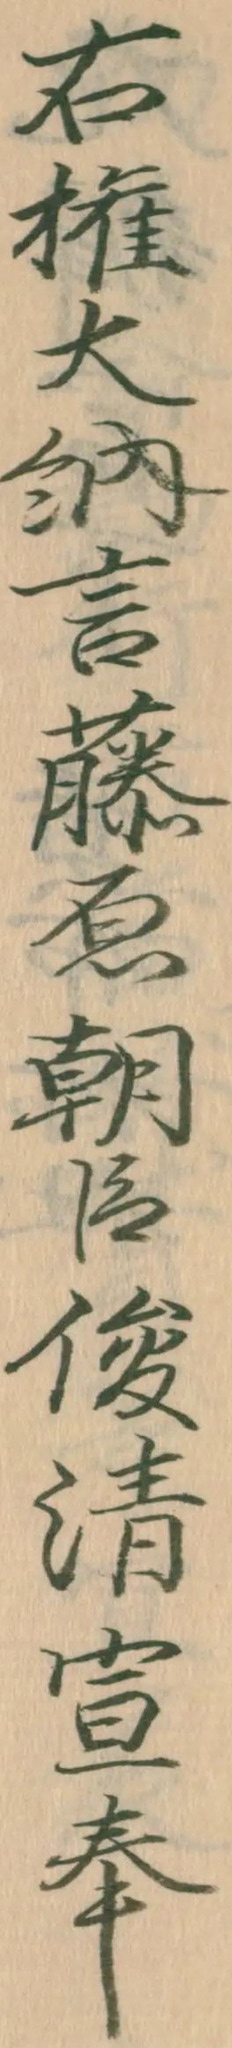右権大納言藤原朝臣俊清宣奉
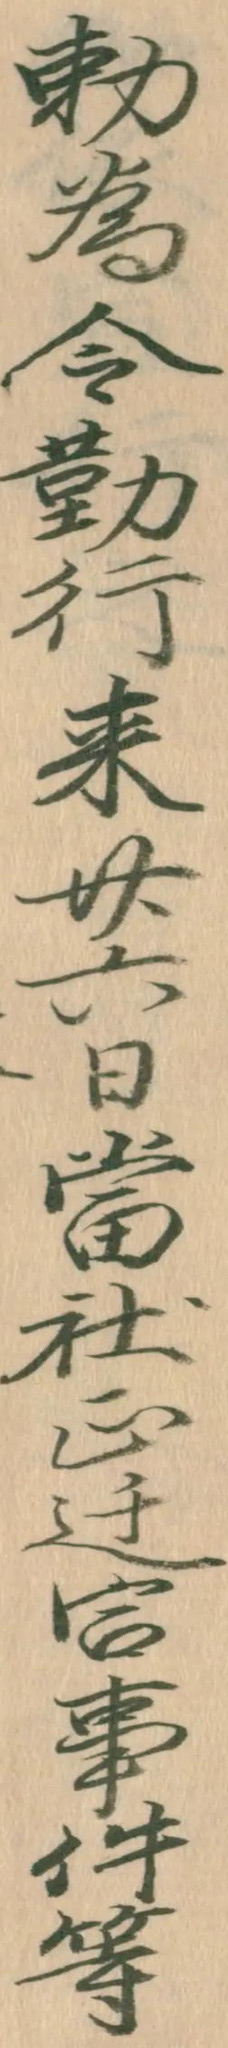勅為令勤行来廿六日当社正迁宮事件等
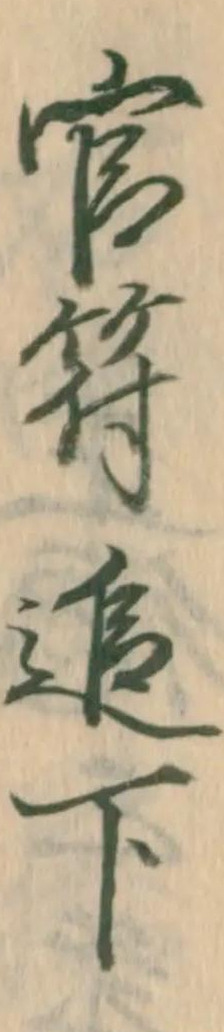官苻追下
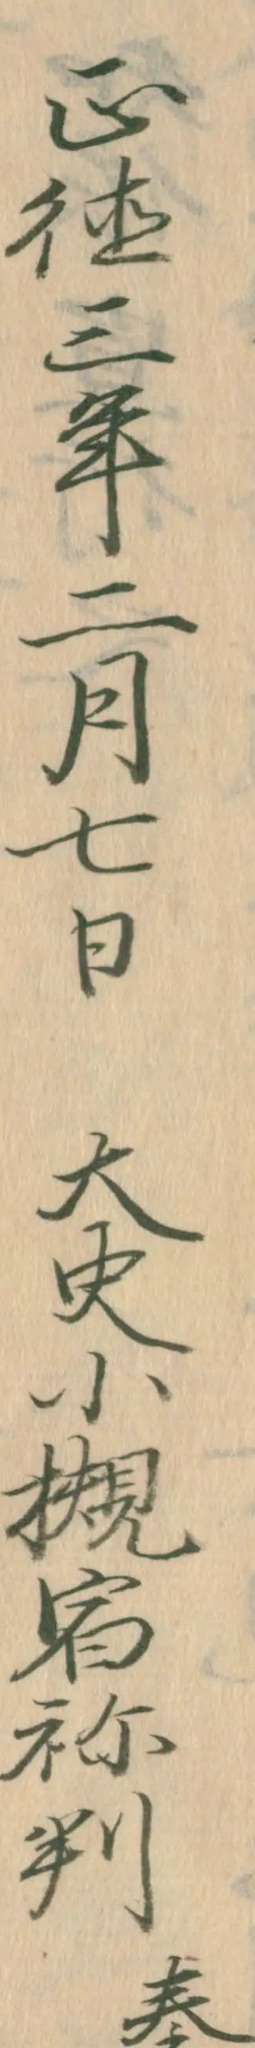正徳三年二月七日大史小槻宿祢判奉
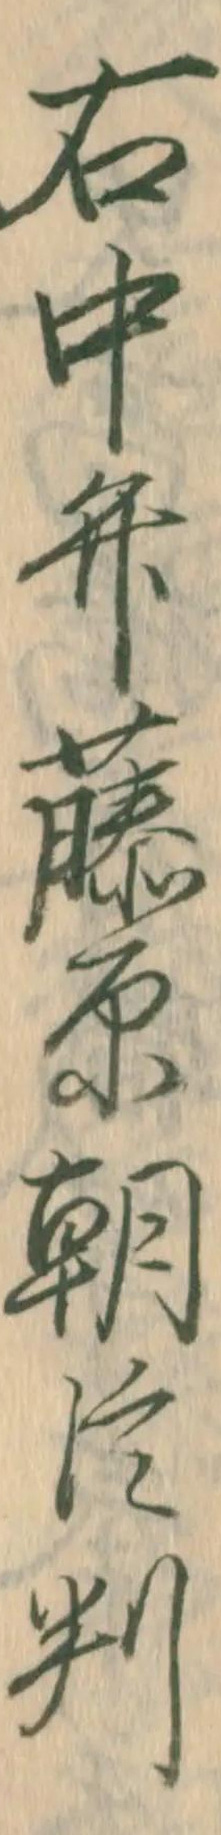右中弁藤原朝臣判
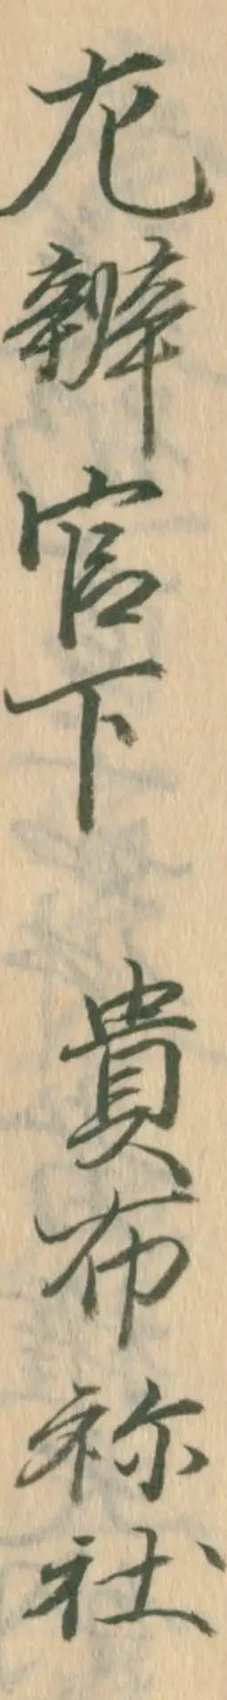左弁官下貴布祢社
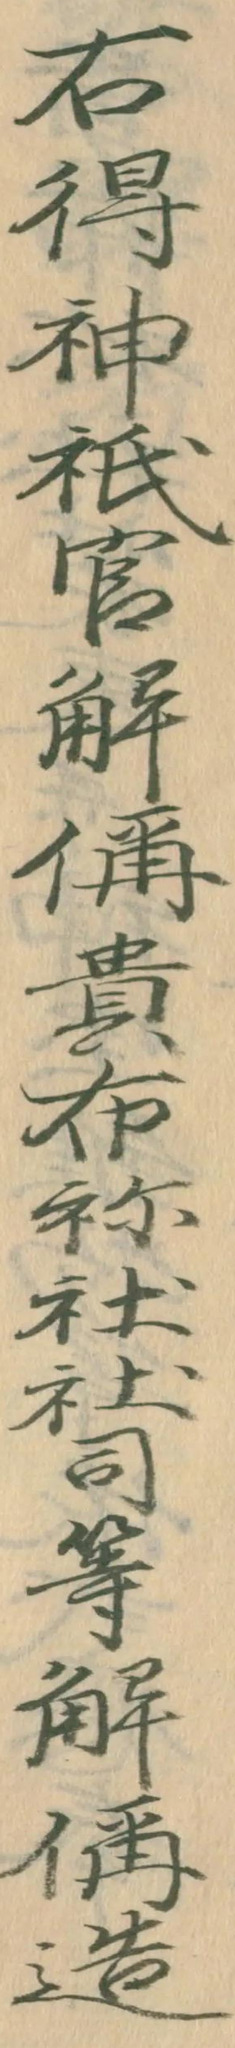右得神祇官解備貴布祢杜社司等解備造

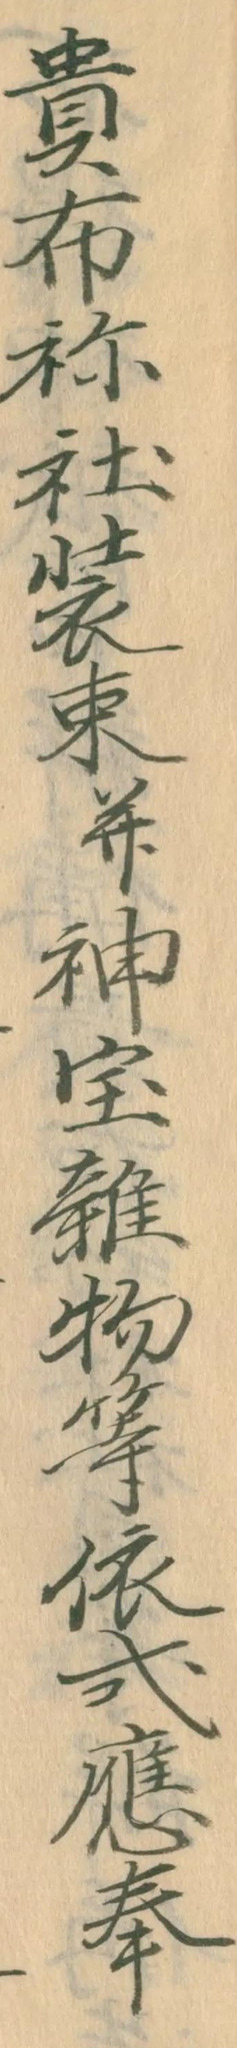貴布祢社装束并神宝雑物等依式応奉
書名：賀茂社記録. 第16冊
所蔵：国立国会図書館 National Diet Library, JAPAN
